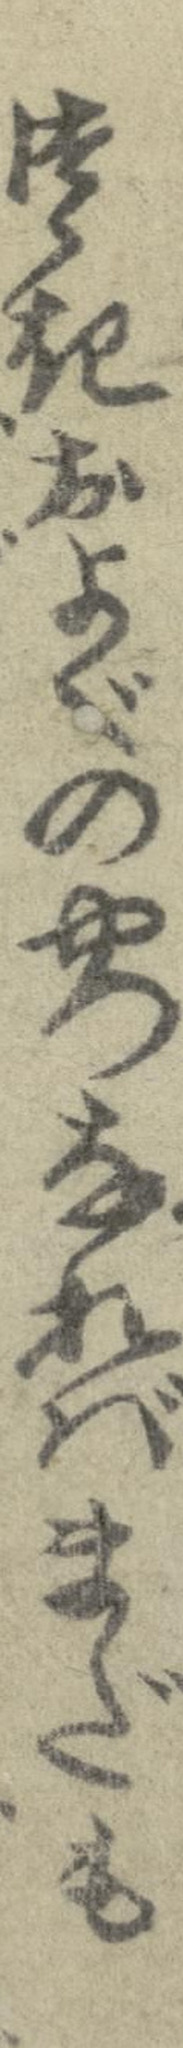つゝきおよぐのやつなればまだも
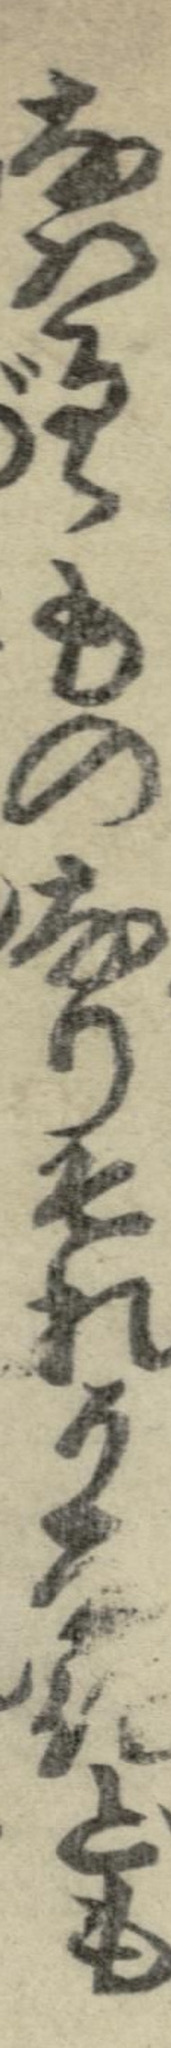なはるゝものなりそれうなきども
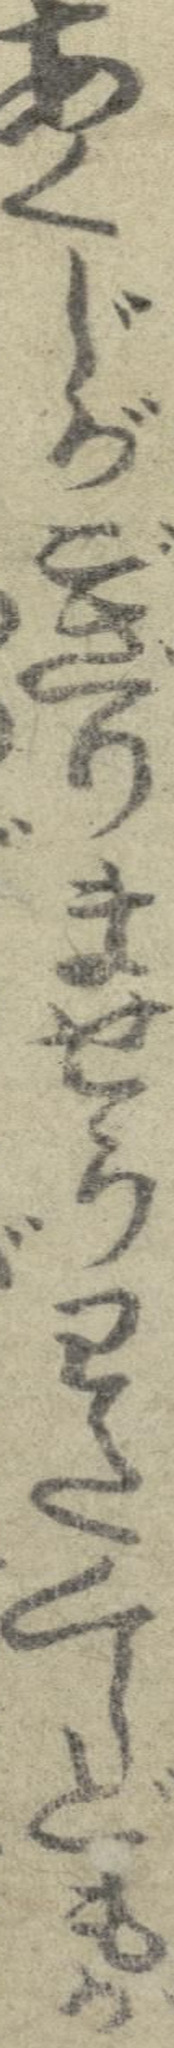あくじがござりませりわたくしどもが
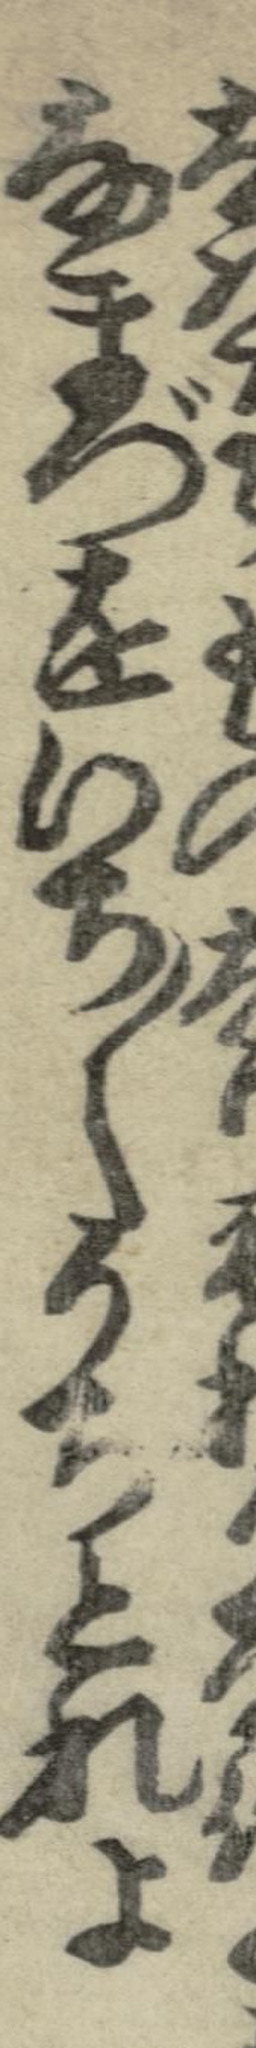なまづをいち〳〵うちとれよ
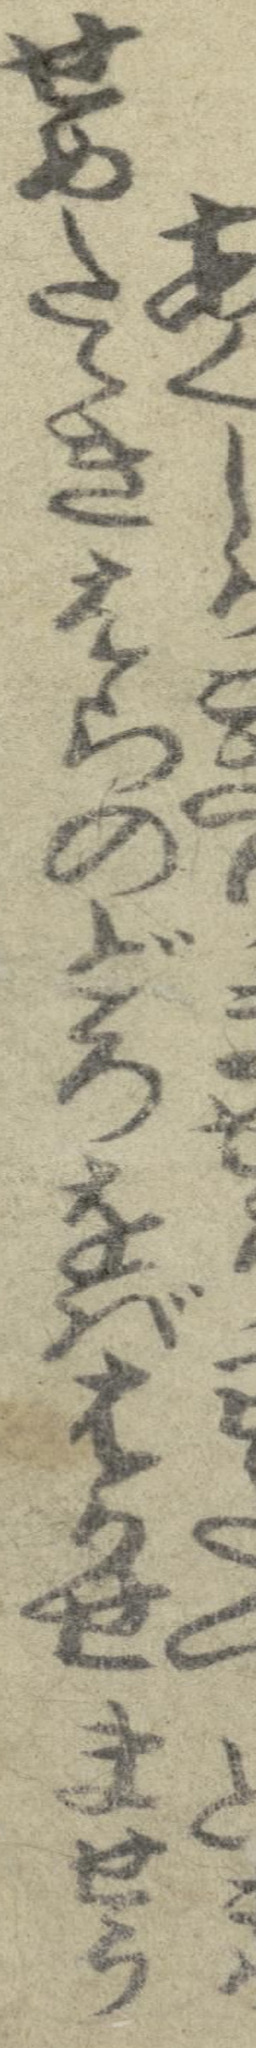せめたゝきはらのどろををばはかせませり
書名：[すい神のおしえにいのちたすかりて]
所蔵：東京大学地震研究所図書室 Earthquake Research Institute Library, The University of Tokyo, JAPAN
